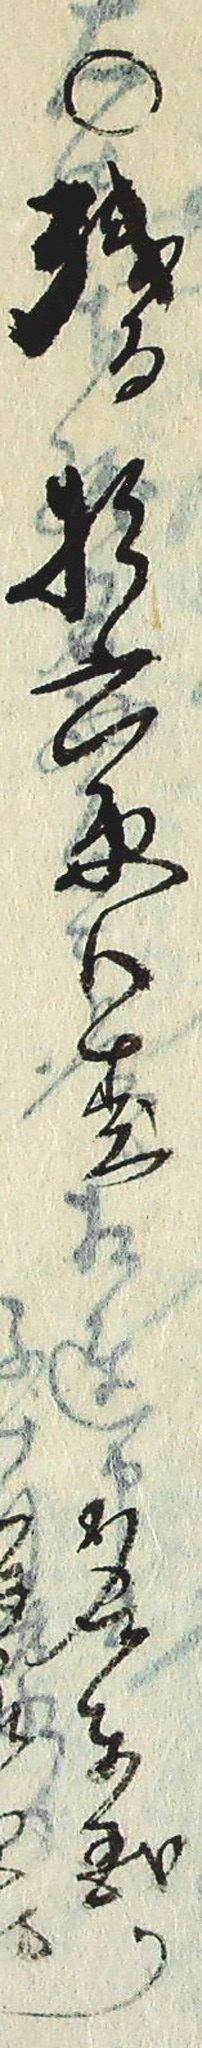残て拾六束八歩名東当り

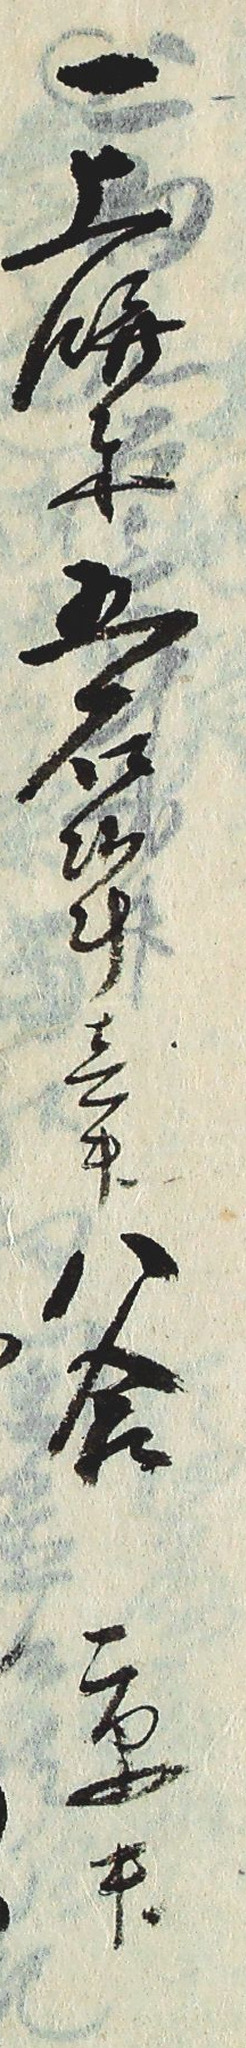一上餅米五石弐斗壱升八合京舛
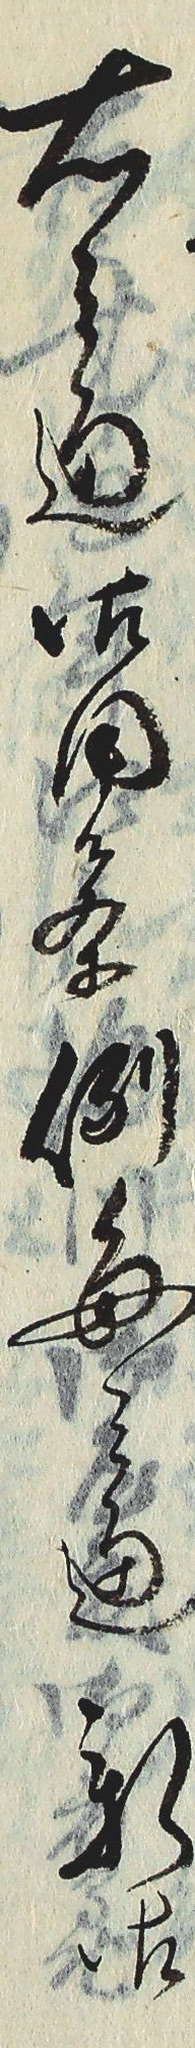右之通御用候条例毎之通新御
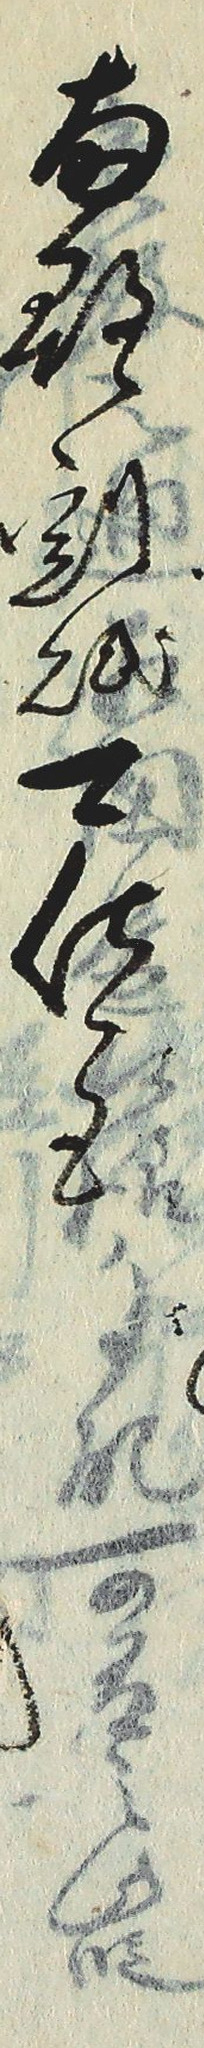両郡へ割賦可仕候以上
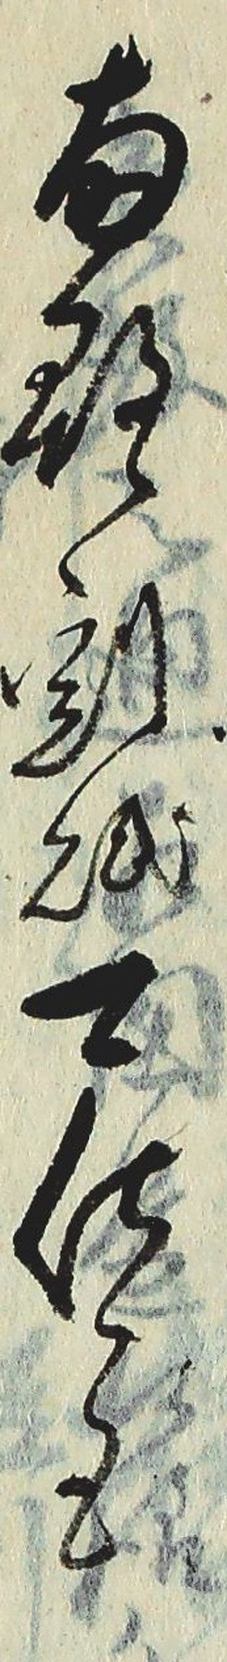両郡へ割賦可仕候以上
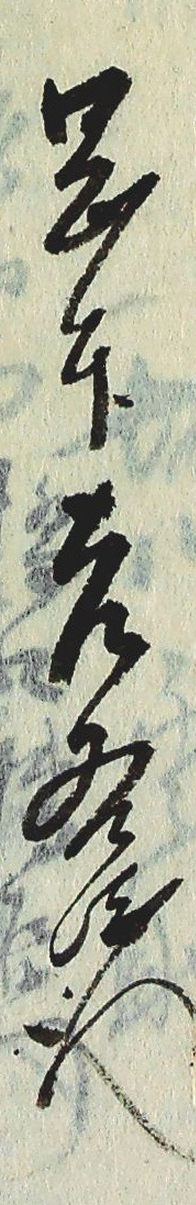岡本吉右衛門
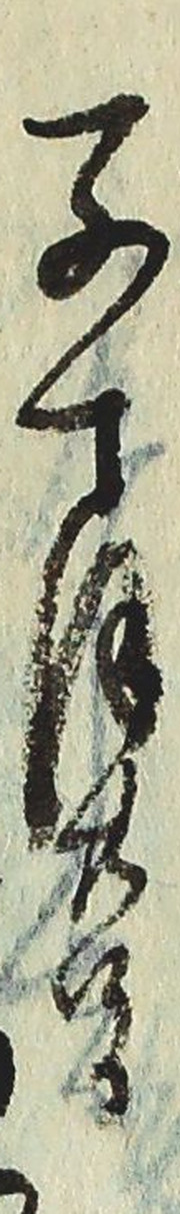子十月廿四日
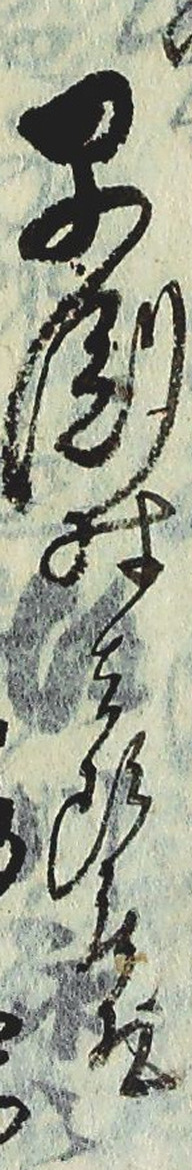早淵村与頭庄屋
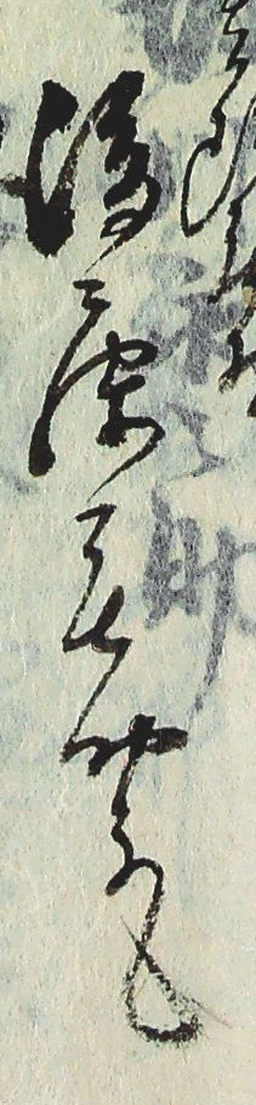後藤庄助方へ
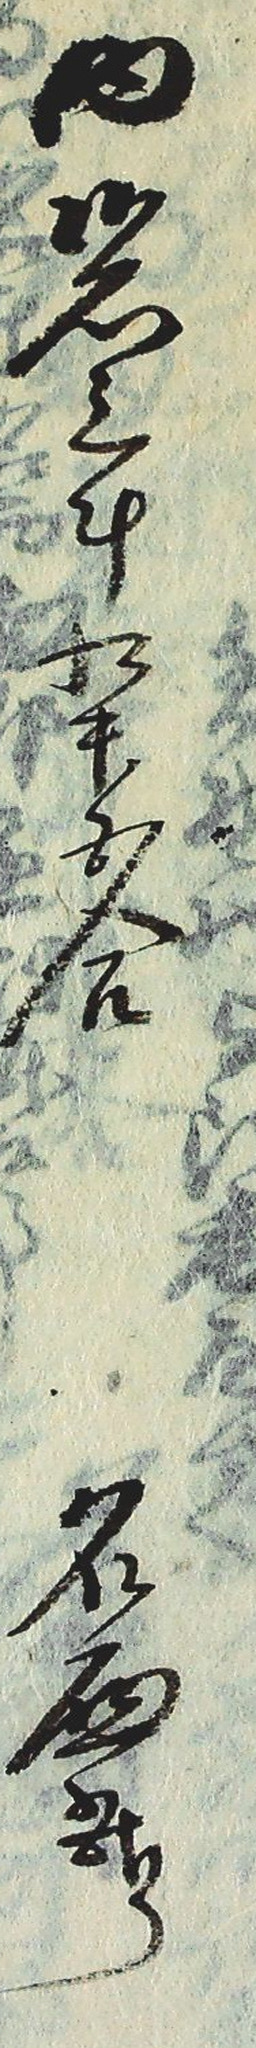内弐石三斗九升五合名西当り
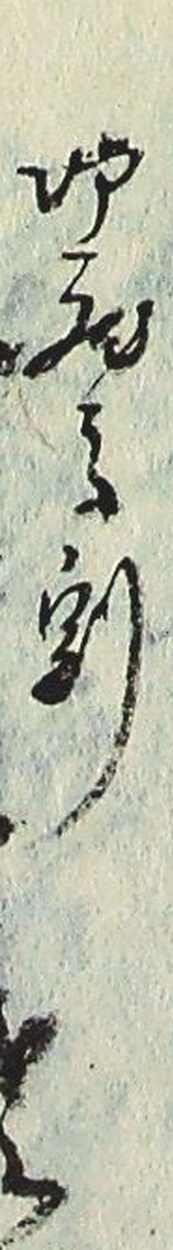御蔵高割
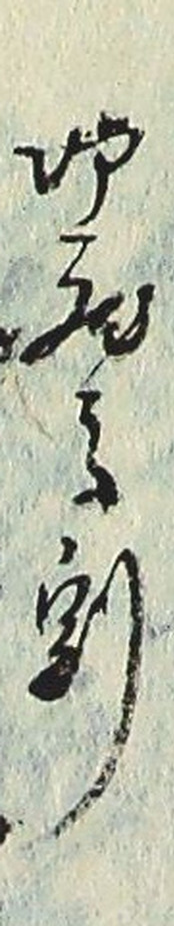御蔵高割
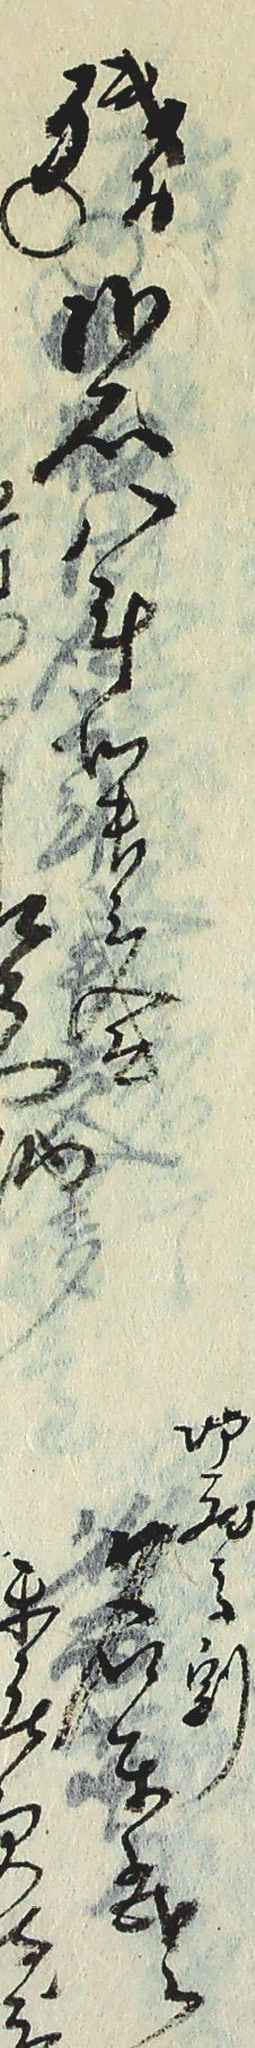残て弐石八斗弐升三合名東当り
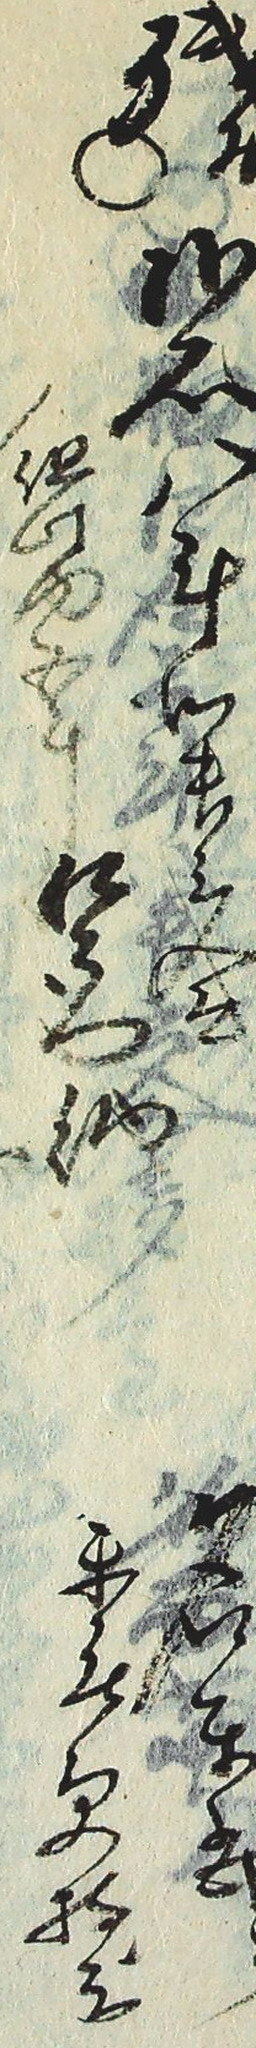但此内五斗郷右衛門納楽屋受持分
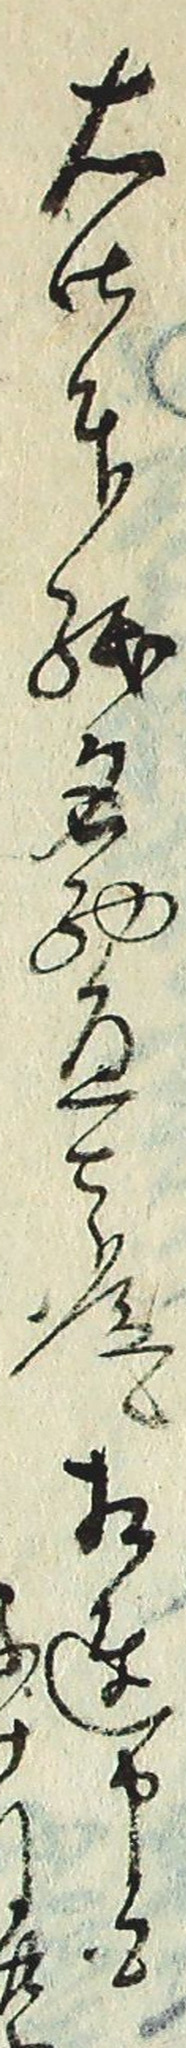右御本紙名西宣七郎殿へ相達申候以上
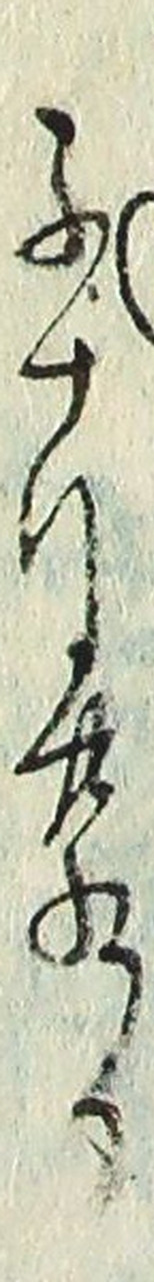子十月廿九日
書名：名東郡中諸割賦元帳
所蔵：鳴門教育大学 Naruto University of Education
